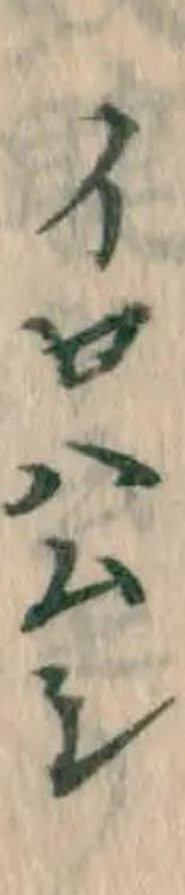イロハムシ
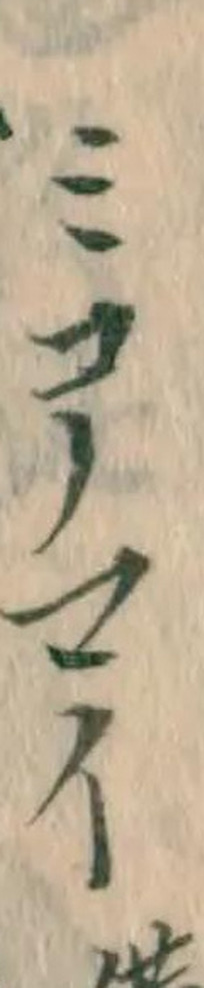ミコノマイ備中
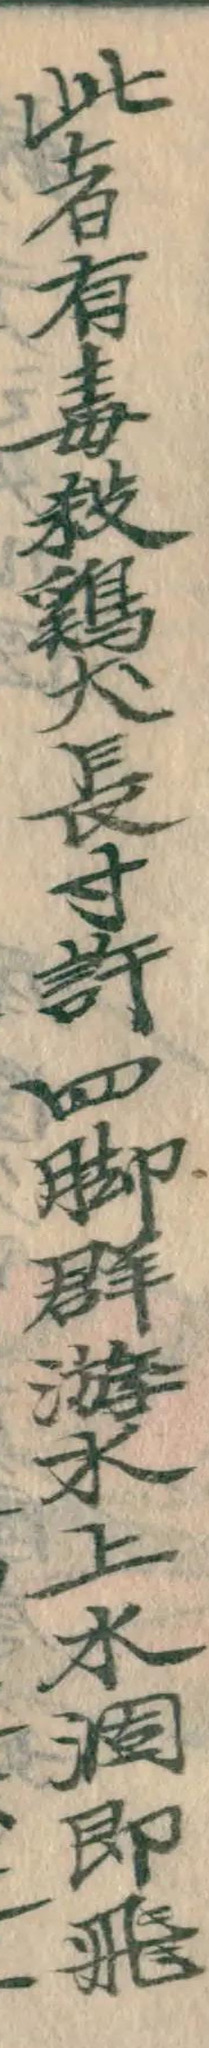此者有毒殺鶏犬長寸許四脚群游水上水涸即飛
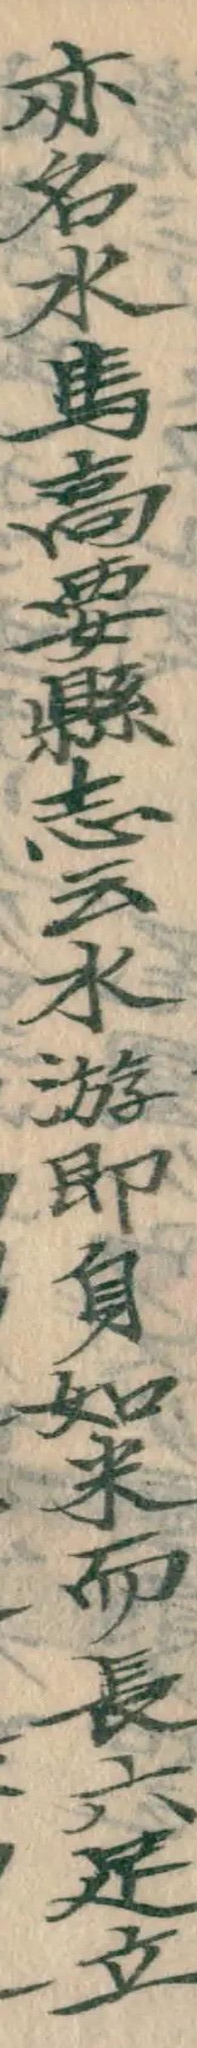亦名水馬高要縣志云水游即身如米而長六足立
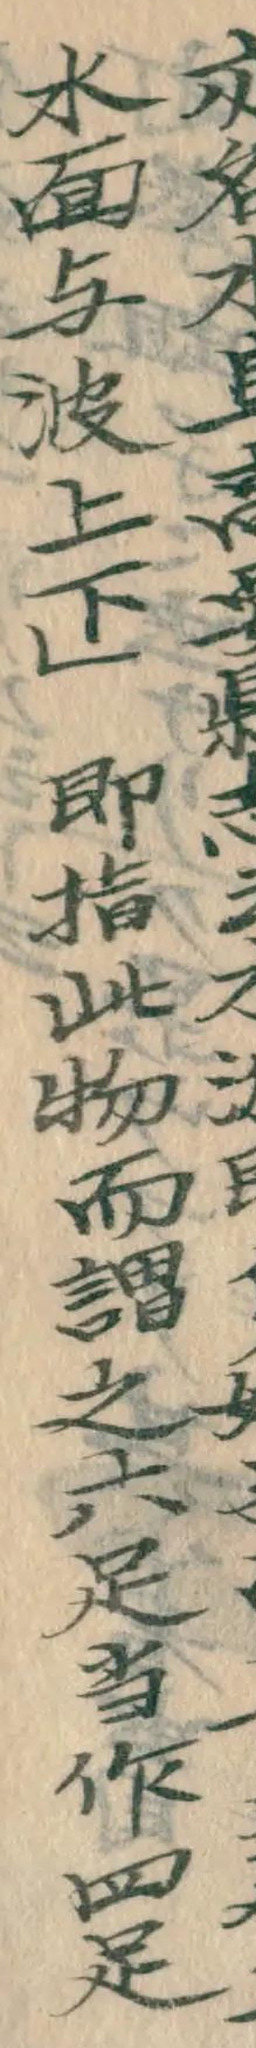水面与波上下」即指此物而謂之六足当作四足

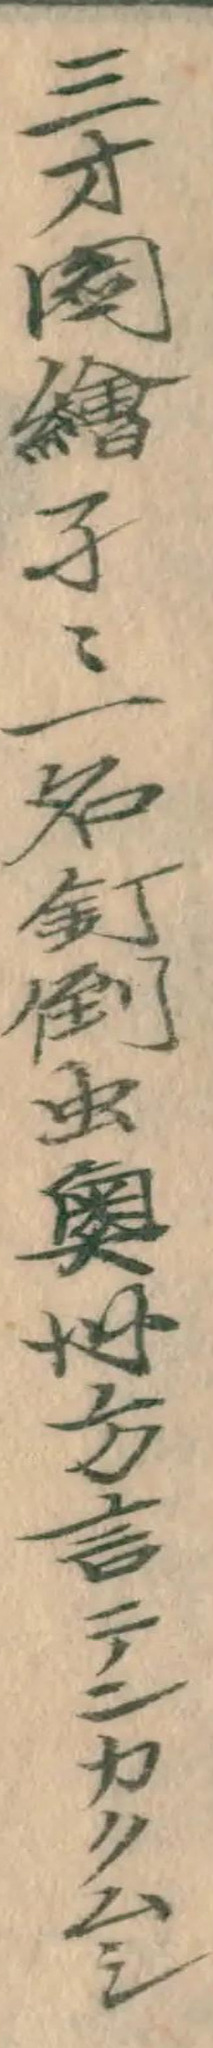三才圖繪孑々一名釘倒虫奥州方言テンカクムシ
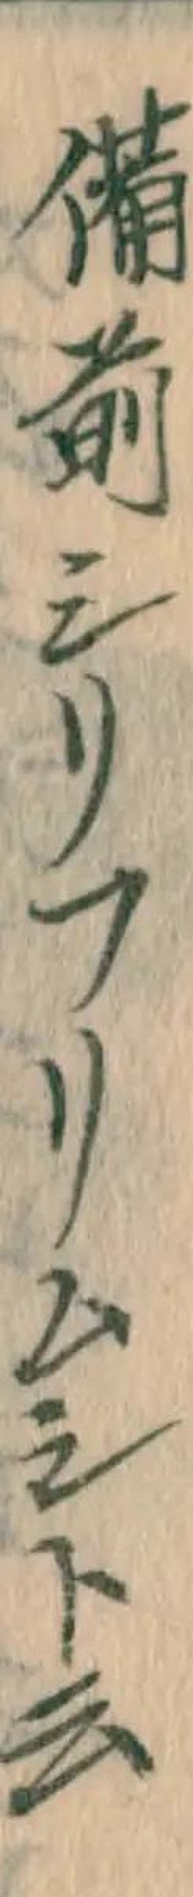備前シリフリムシト云
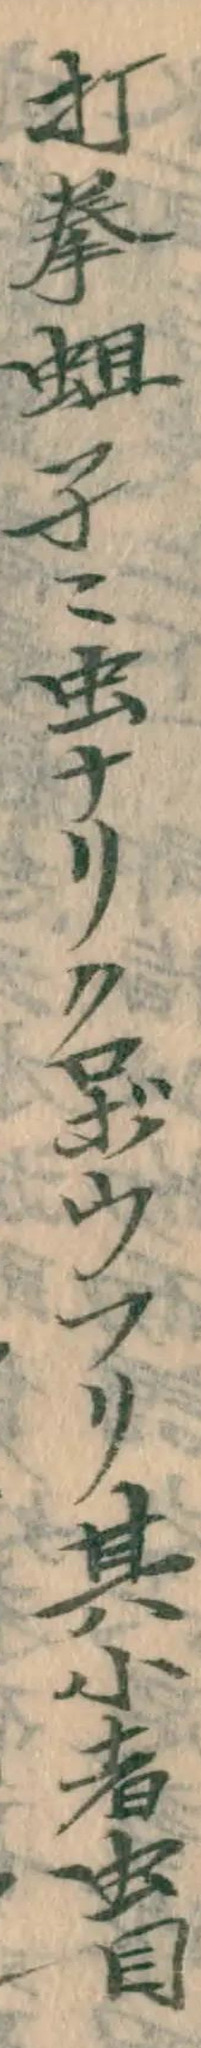打拳蛆孑々虫ナリクロボウフリ其小者虫目
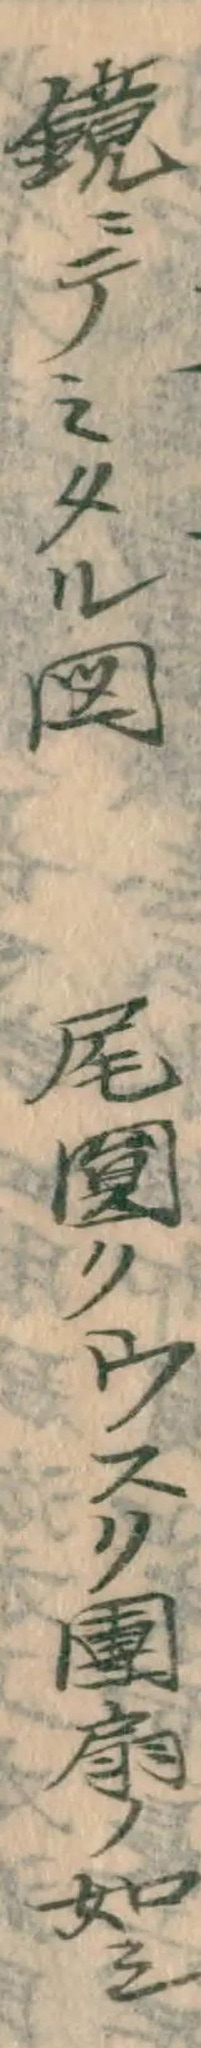鏡ニテミタル図尾圓クウスク團扇ノ如シ
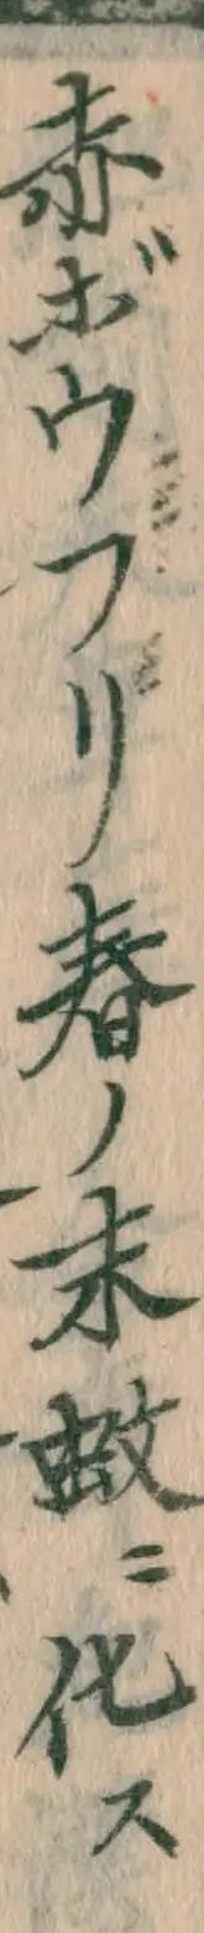赤ボウフリ春ノ末蚊ニ化ス
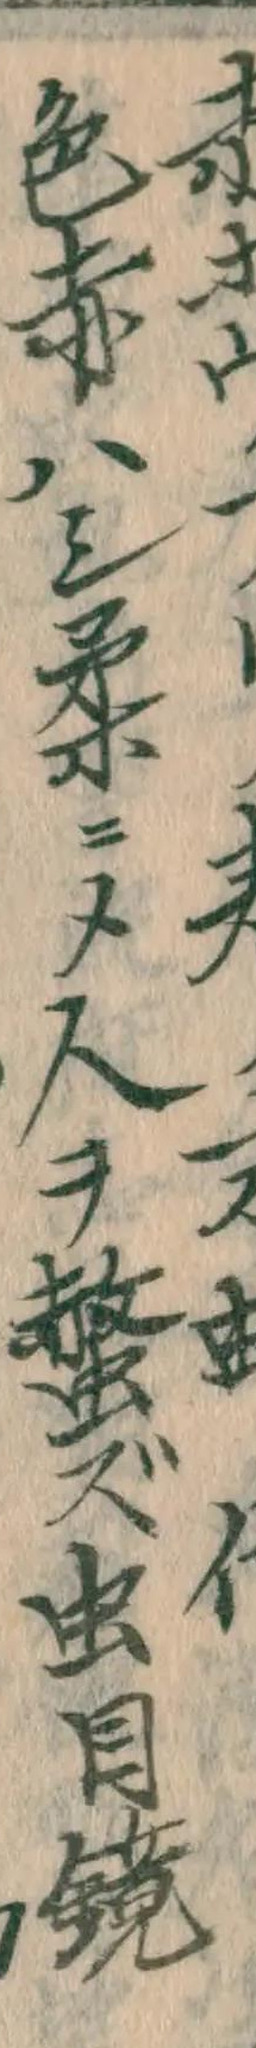色赤ハシ柔ニシテ人ヲ螫ズ虫目鏡
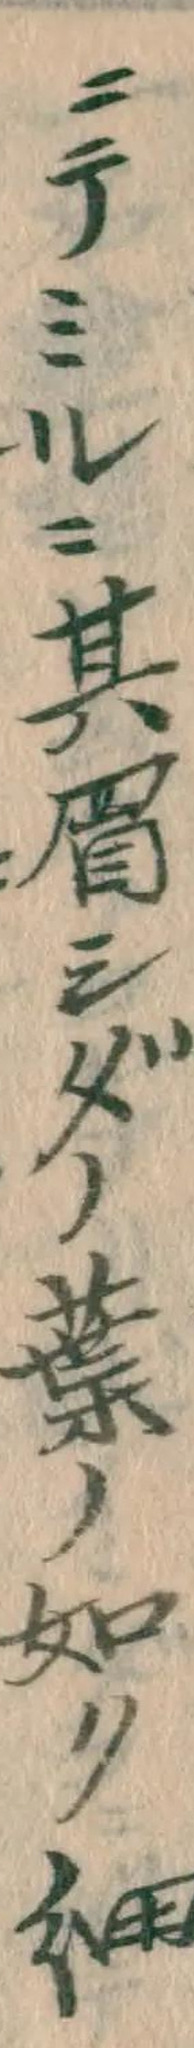ニテミルニ其眉シダノ葉ノ如ク細
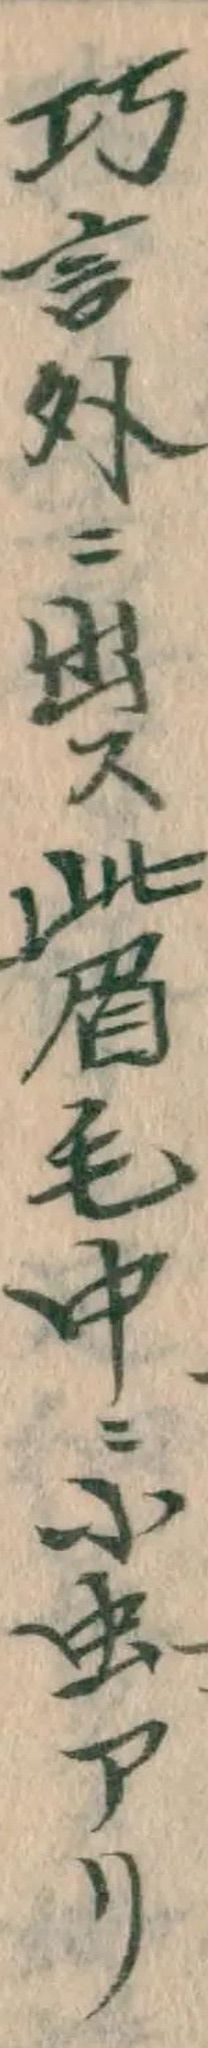巧言外ニ出ス此眉毛中ニ小虫アリ
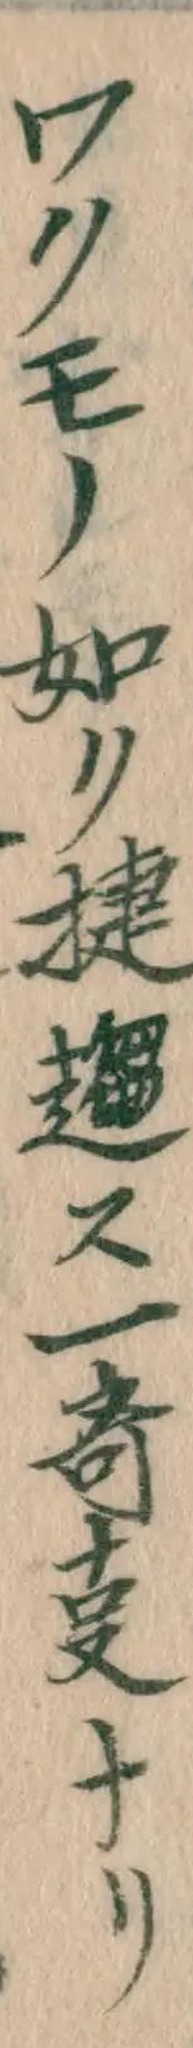ワクモノ如ク捷趨ス一奇㕝ナリ
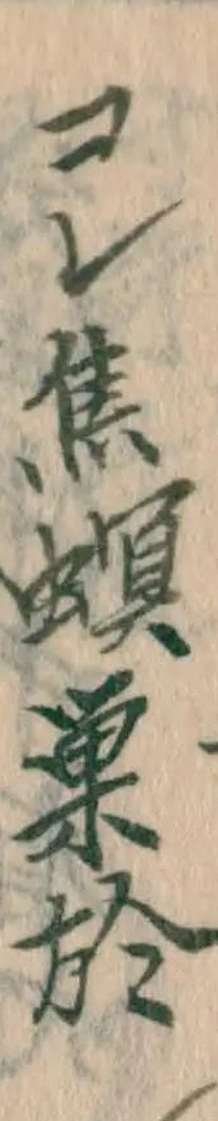コレ焦螟巣於
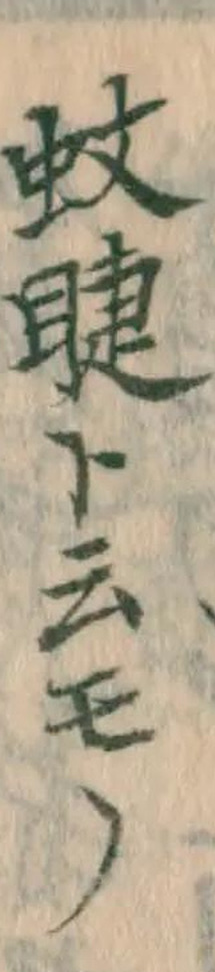蚊睫ト云モノ
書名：千蟲譜 3巻. [2]
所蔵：国立国会図書館 National Diet Library, JAPAN
